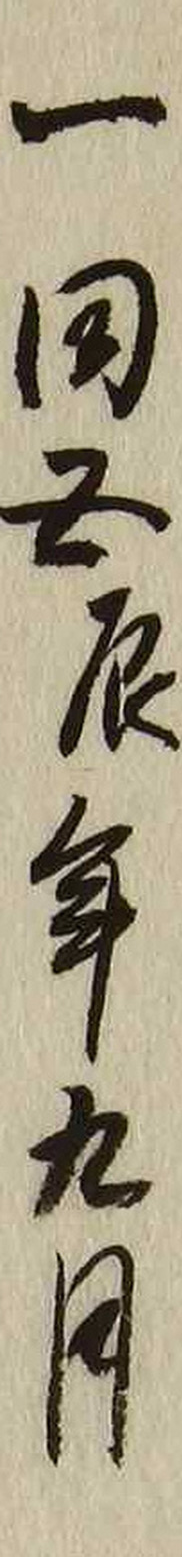一同五辰年九月
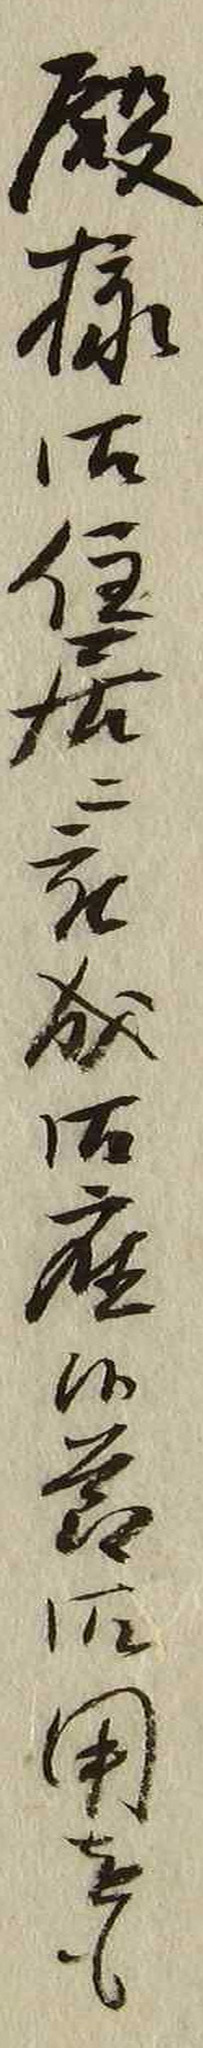殿様御住居ニ被成御座候節御用をも
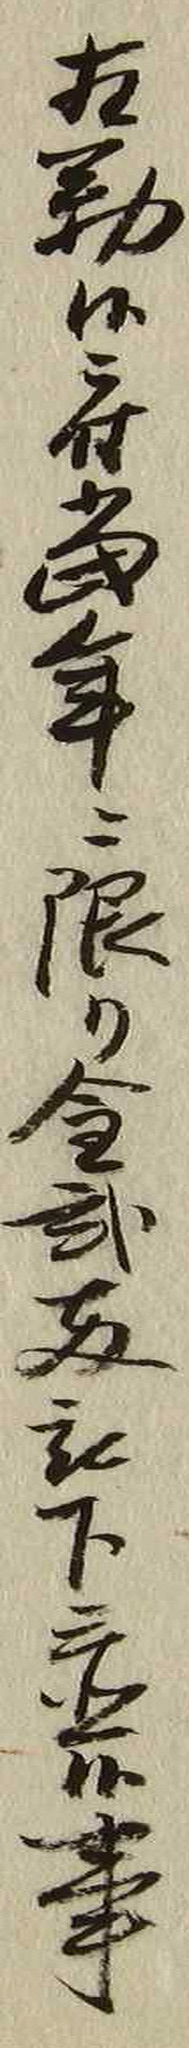相勤候ニ付当年ニ限り金弐両被下置候事
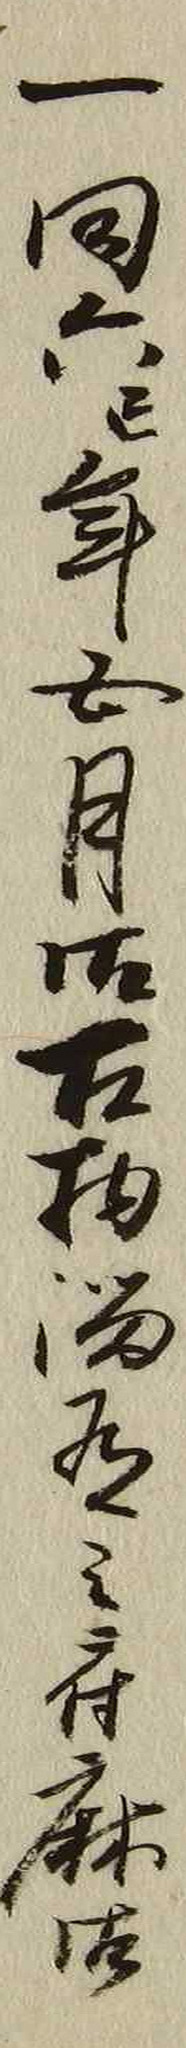一同六巳年五月御古物溜有之ニ付麻御
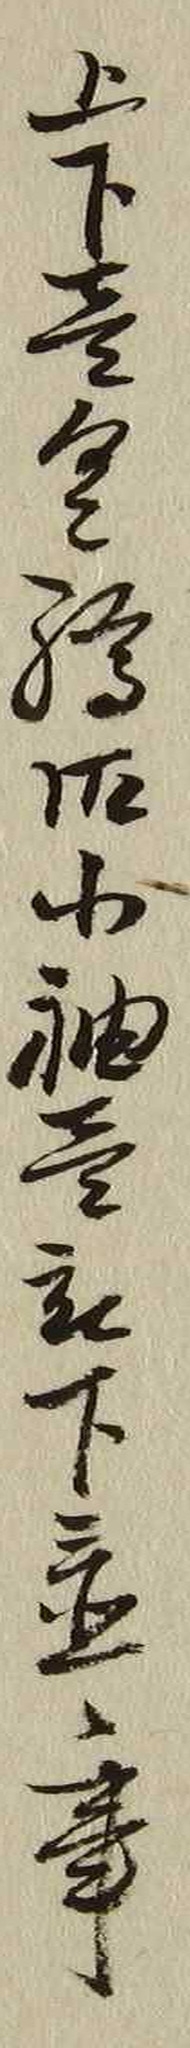上下壱具縞御小袖壱被下置候事
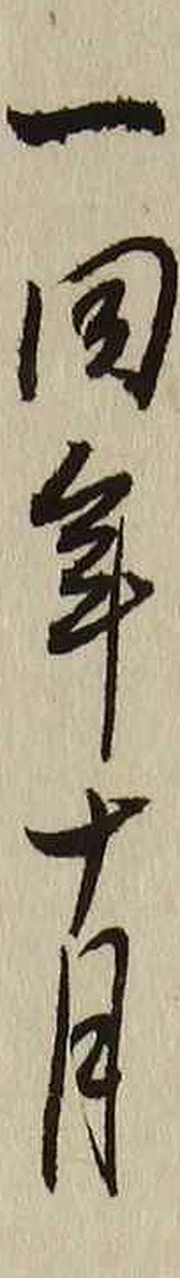一同年十月
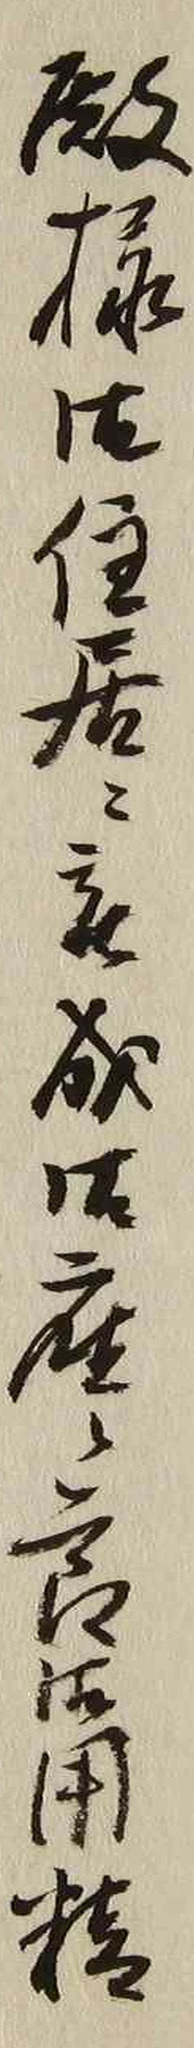殿様御住居ニ被成御座候節御用精
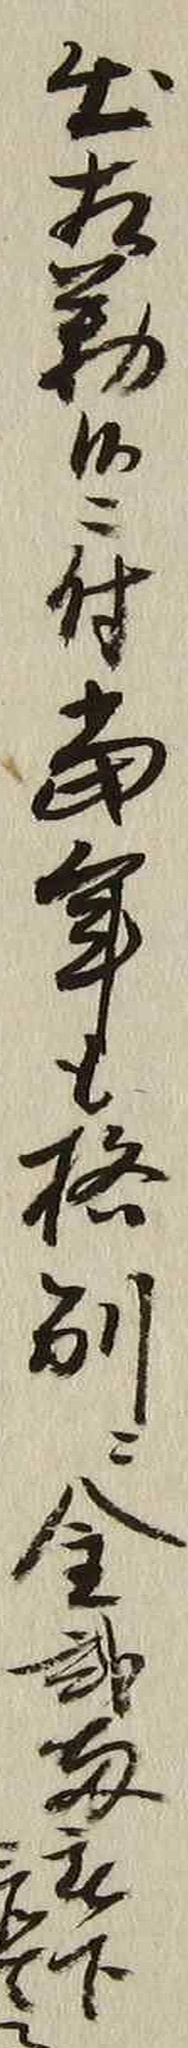出相勤候ニ付当年も格別ニ金弐両被下置候事
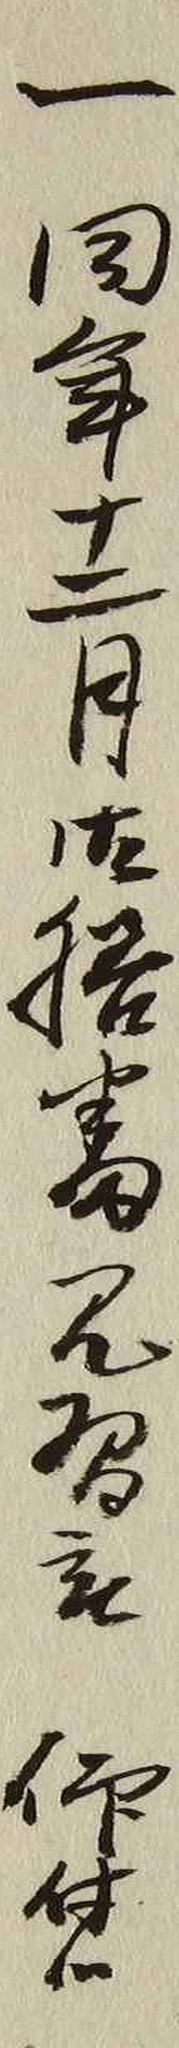一同年十二月御膳番見習被仰付候
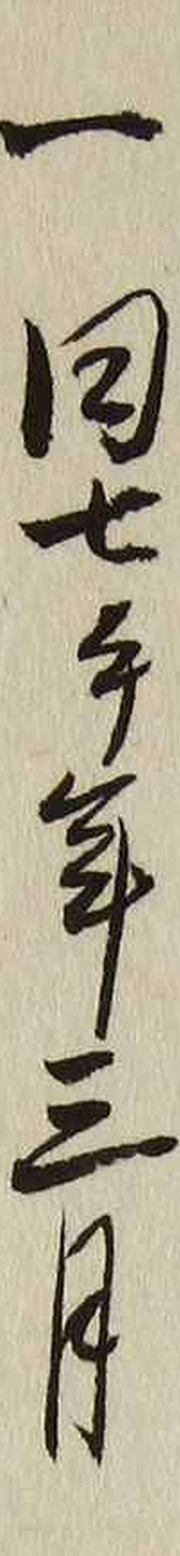一同七午年三月
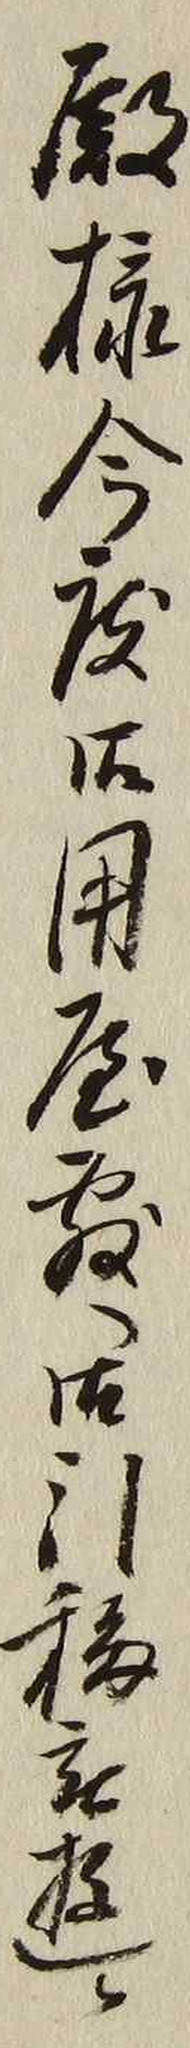殿様今度御用屋敷へ御引移被遊候
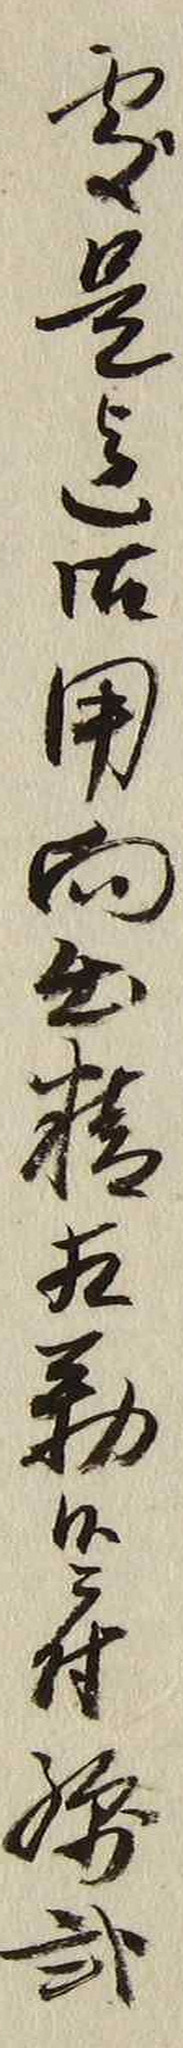処是迄御用向出精相勤候ニ付綿弐
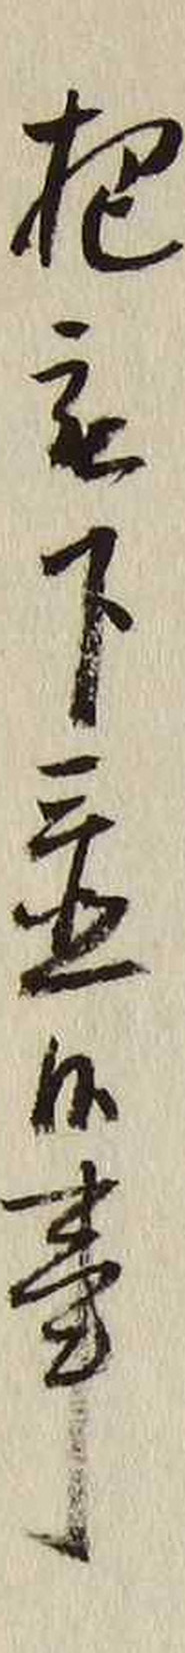把被下置候事
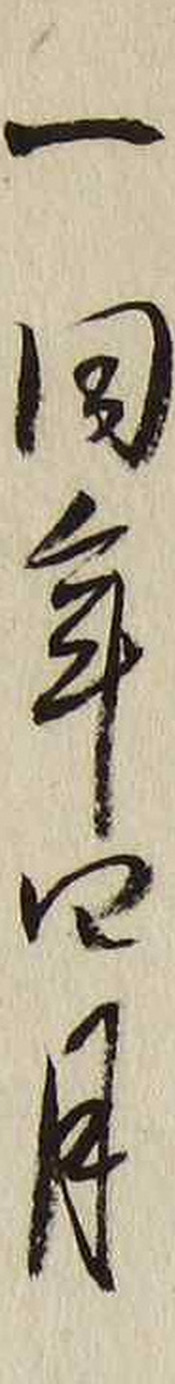一同年四月
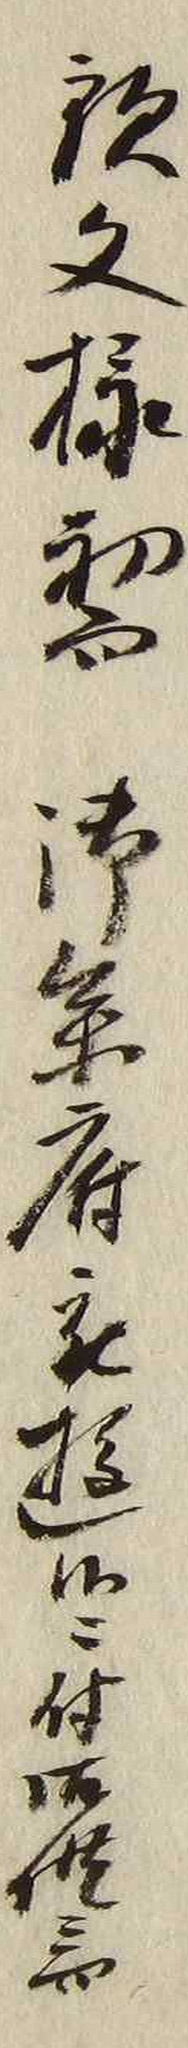欽文様初而御参府被遊候ニ付御供ニ而

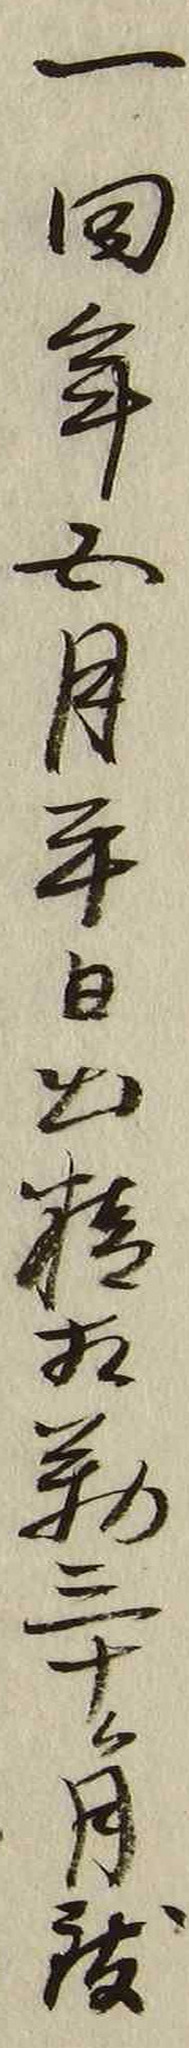一同年五月平日出精相勤三十ケ月致
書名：諸士系譜　巻之356　す之部6
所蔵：会津若松市立会津図書館
